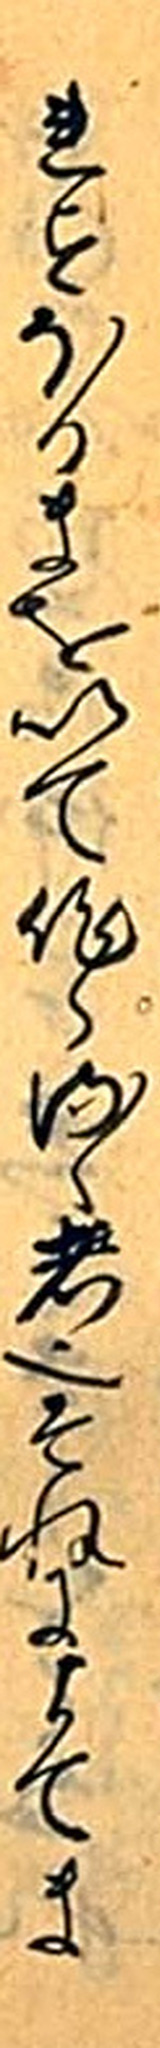れすほるまを以て作らるゝ者也それによてま
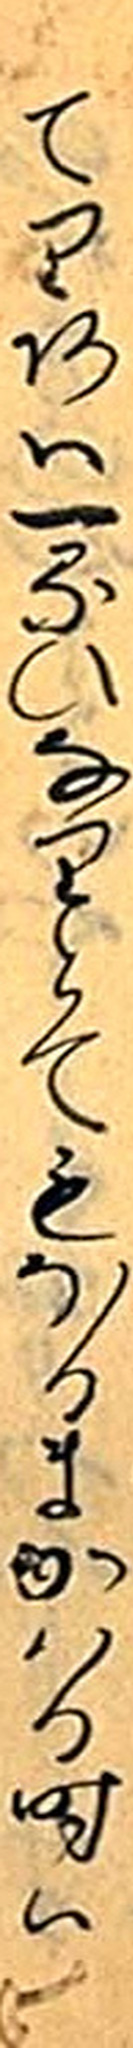てりあは一るひなりとてもほるまかはる時は
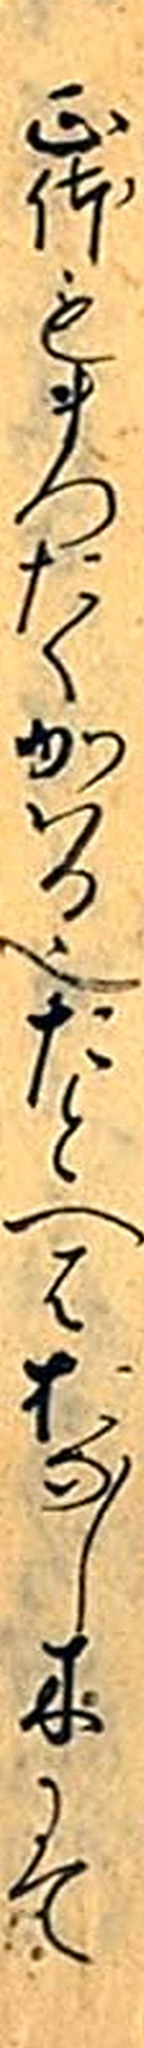正体もまつたくかはる也たとへはおなし木にて
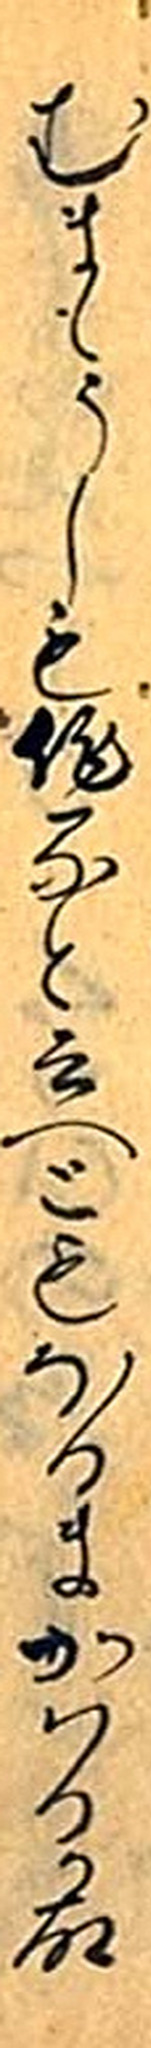むまもうしも作ると云へともほるまかはるか故
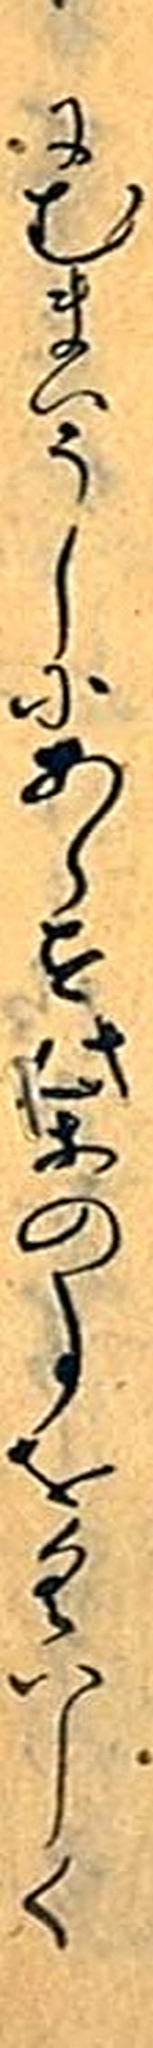にむまはうしにあらす此等の事をくはしく
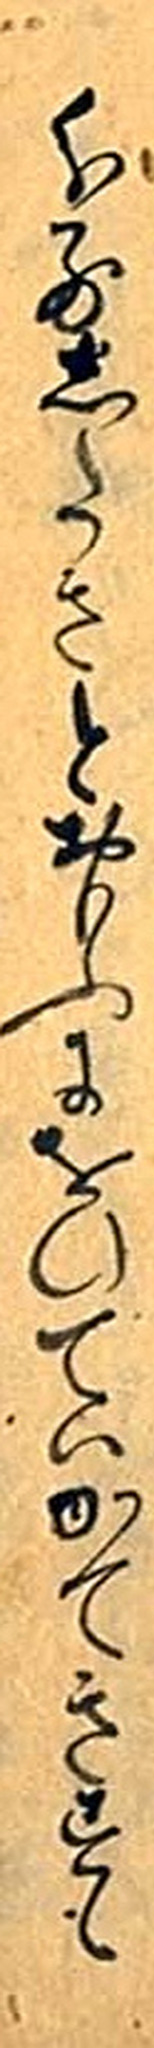分別したきとおもふにをひてはかてきすも
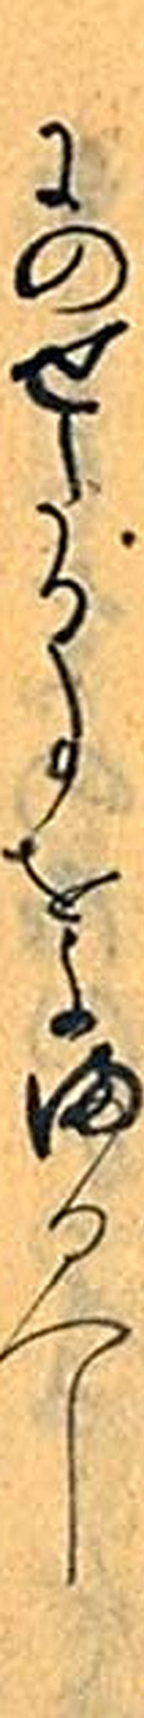にのせたる事をよまるへし
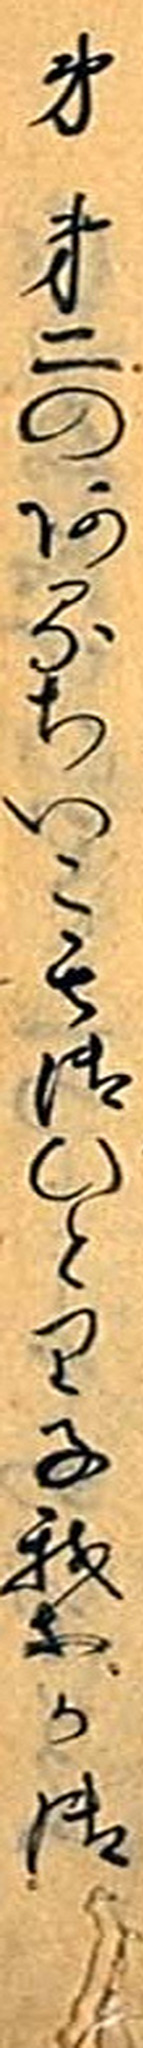弟第二のあるちいこ其御ひとり子我等か御
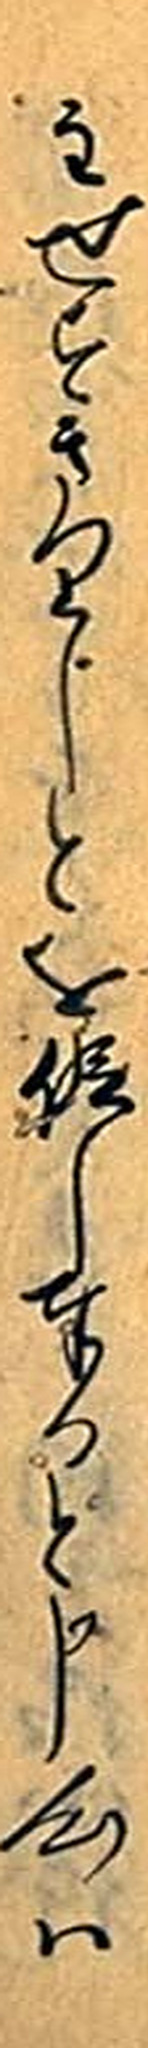主せすきりしとを信し奉ると申心は
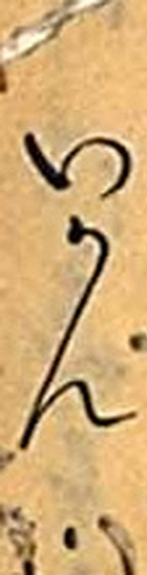いかん

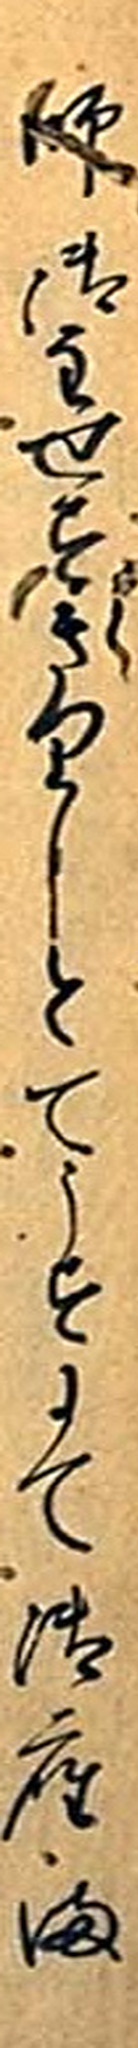師御主せすきりしとてうすにて御座ま
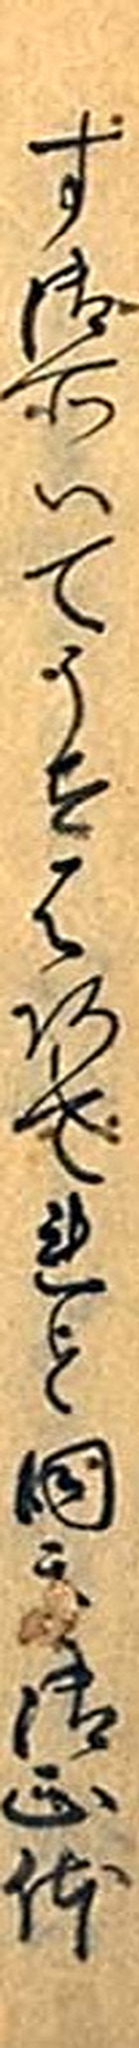す御所はてうすはあてれと同き御正体
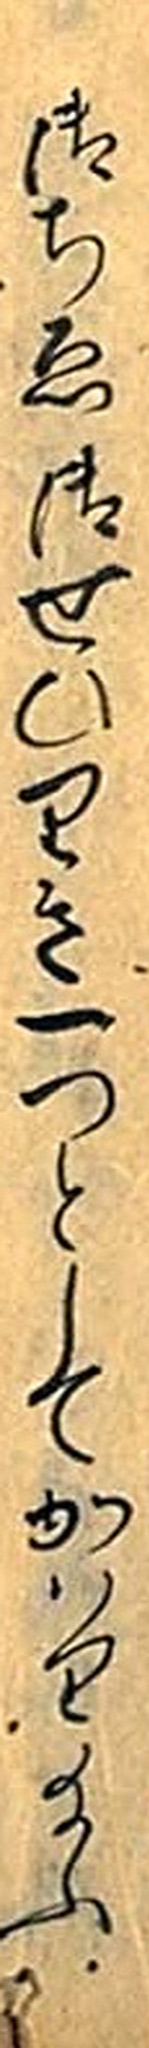御ちゑ御せひりき一つとしてかはり給ふ
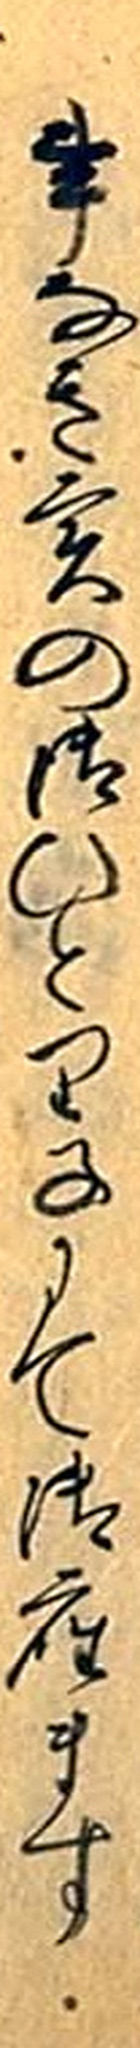事なき実の御ひとり子にて御座ます
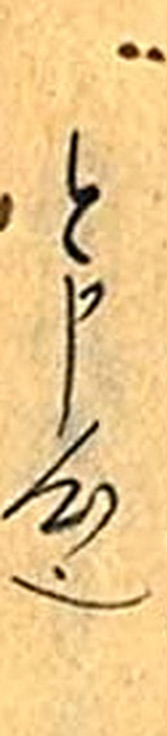と申心也
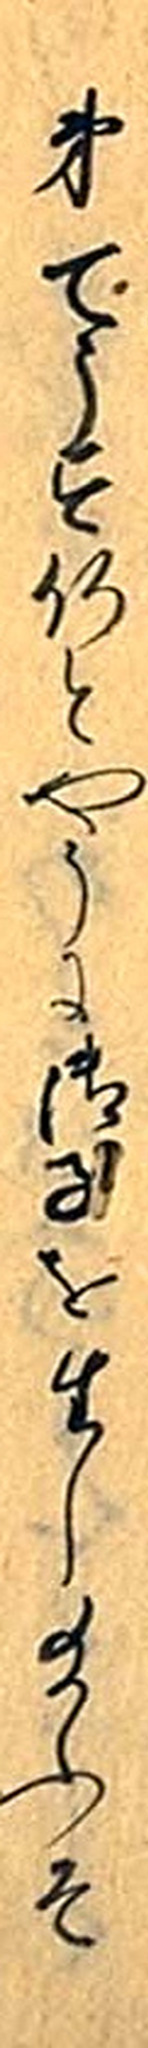弟てうす何とやうに御子を生し給ふそ
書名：ドチリナ・キリシタン
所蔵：東京大学総合図書館 / General Library in the University of Tokyo
